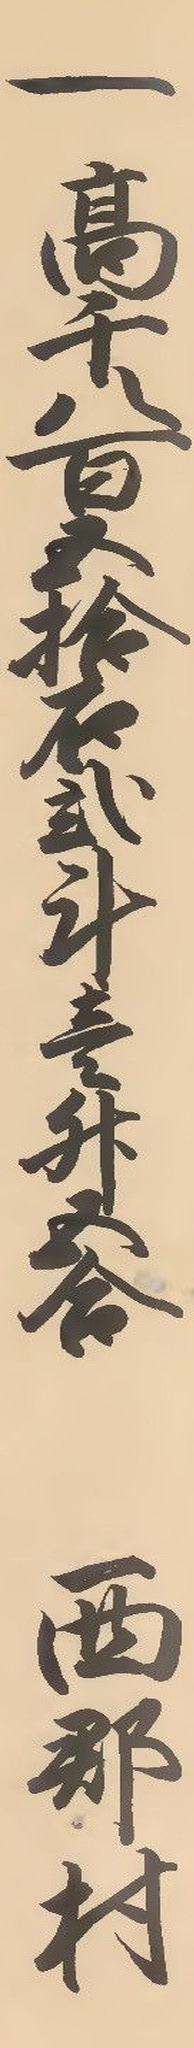一高千八百五拾石弐斗壱升五合西郡村
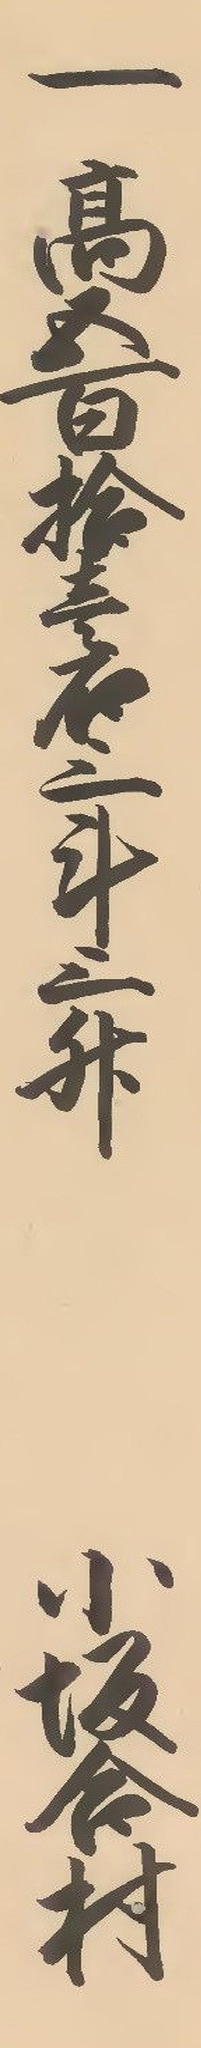一高五百拾壱石三斗三升小坂合村
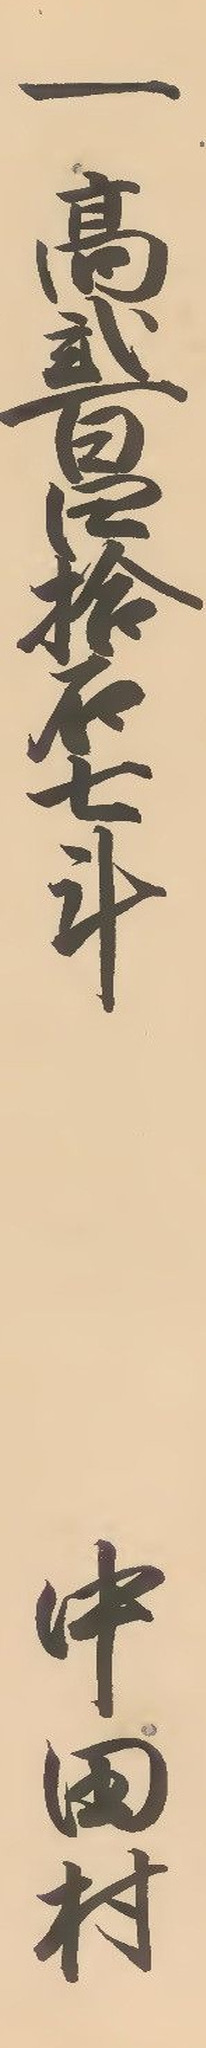一高弐百四拾石七斗中田村
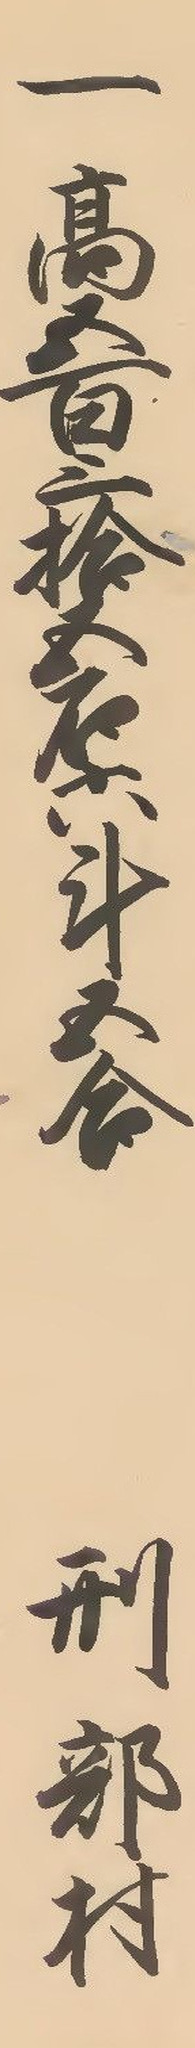一高五百三拾五石六斗五合刑部村

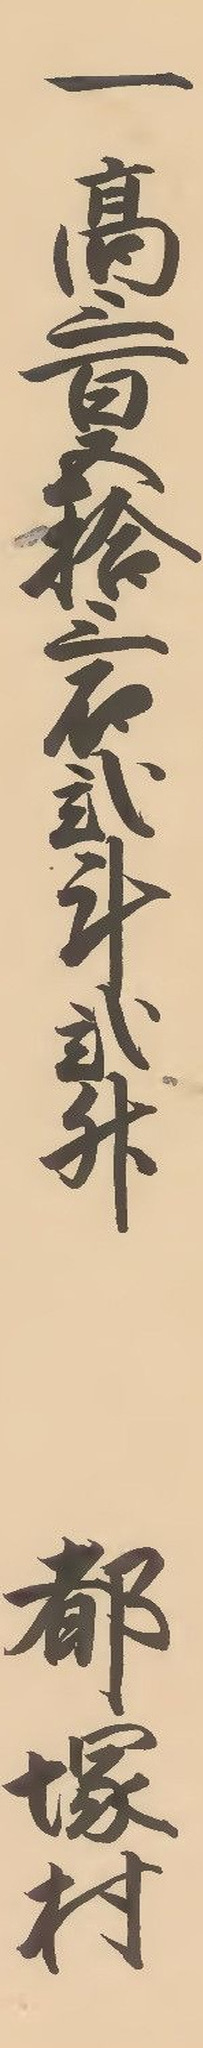一高三百五拾三石弐斗弐升都塚村
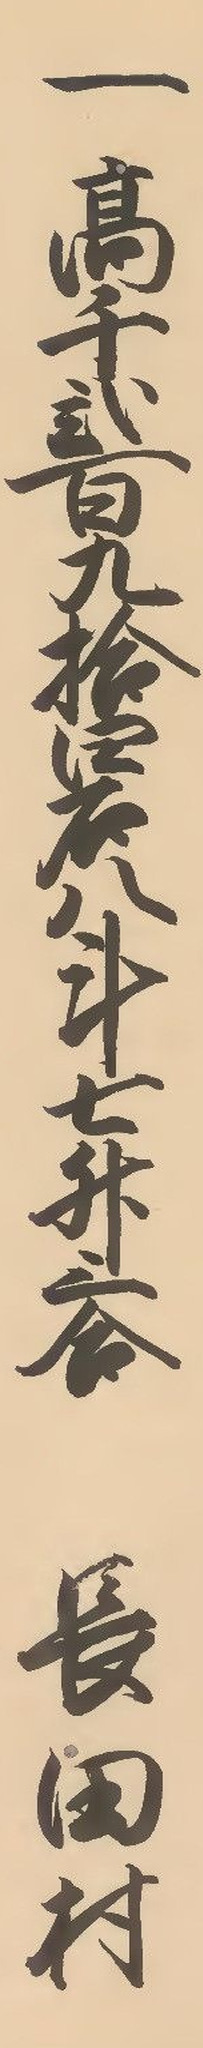一高千弐百九拾四石八斗七升三合長田村
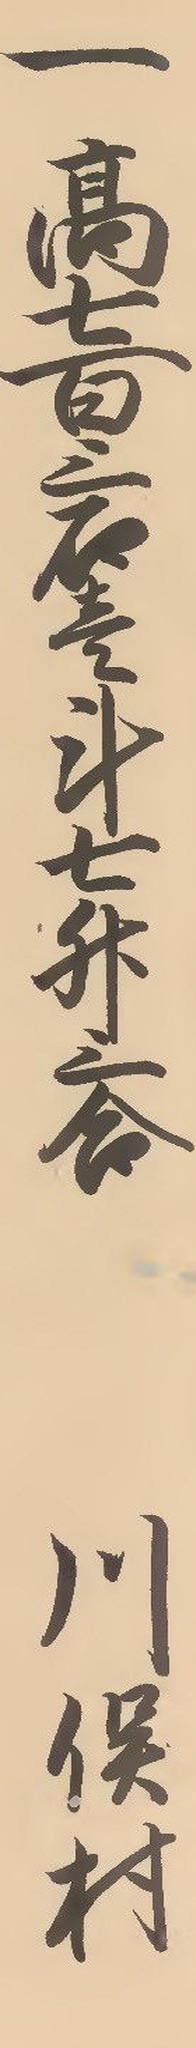一高七百三石壱斗七升三合川俣村
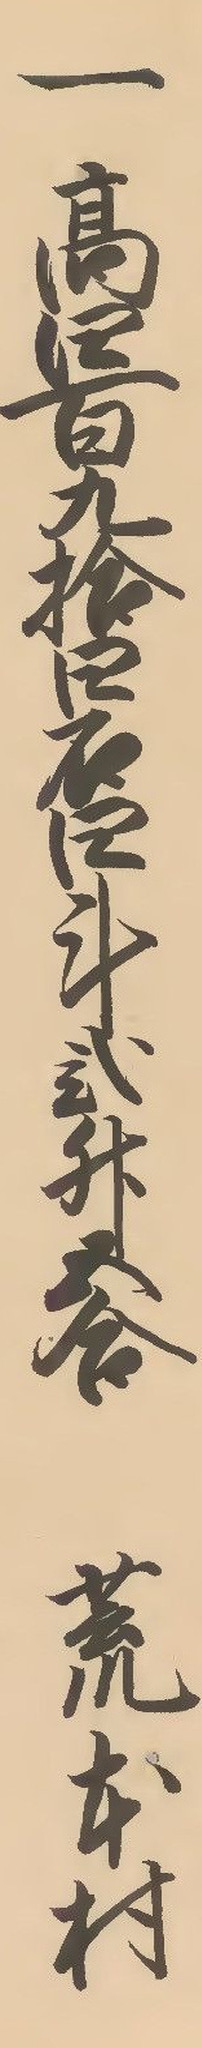一高四百九拾四石四斗弐升五合荒本村
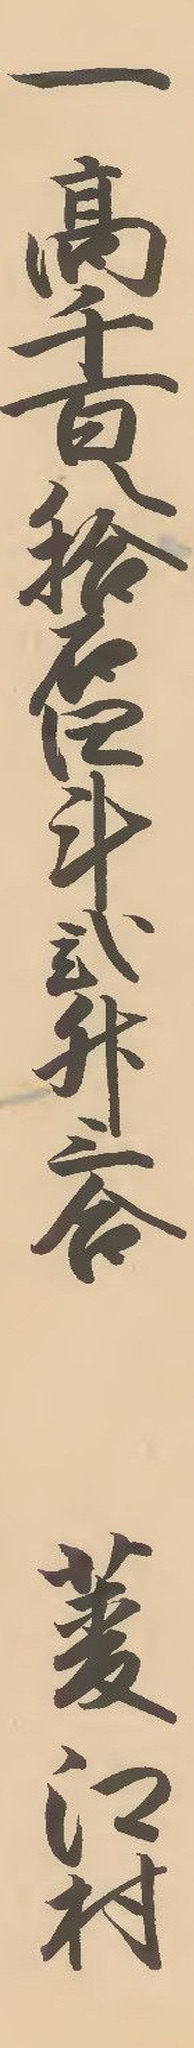一高千百八拾石四斗弐升三合菱江村

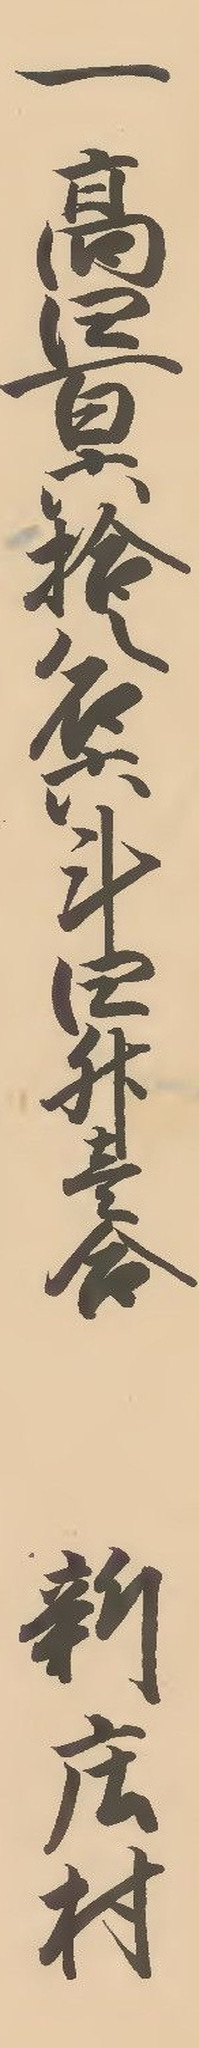一高四百六拾八石六斗四升壱合新庄村
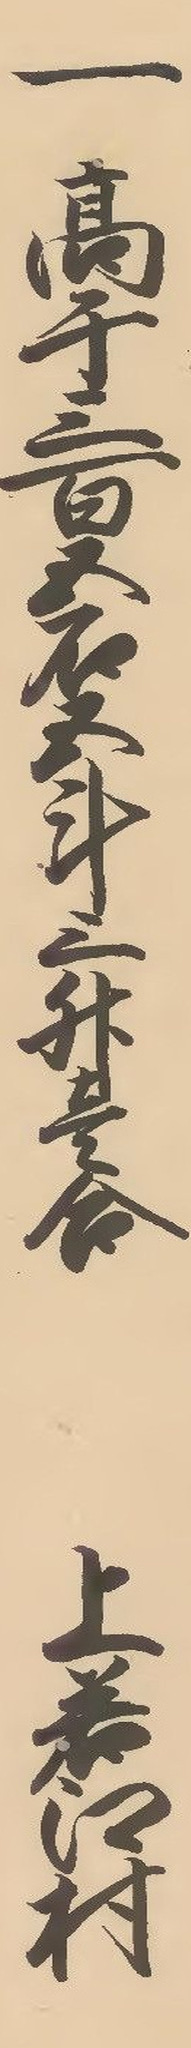一高千三百五石五斗三升壱合上若江村
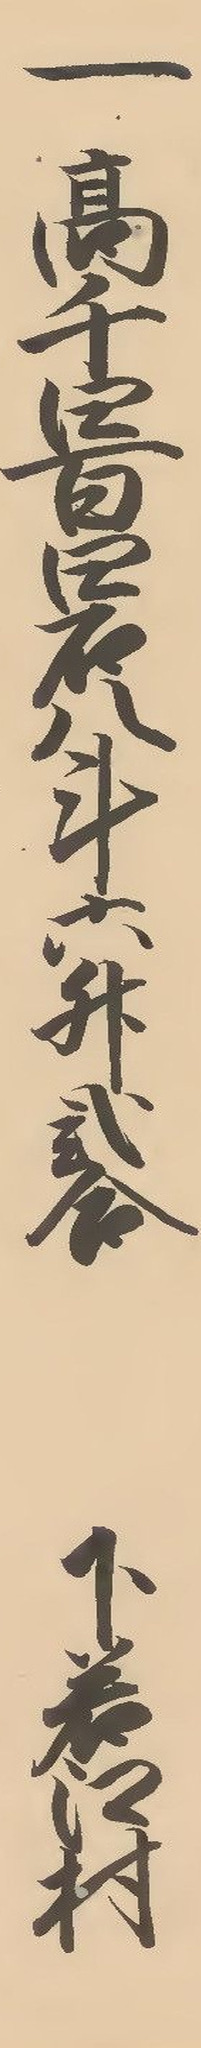一高千四百四石八斗六升弐合下若江村
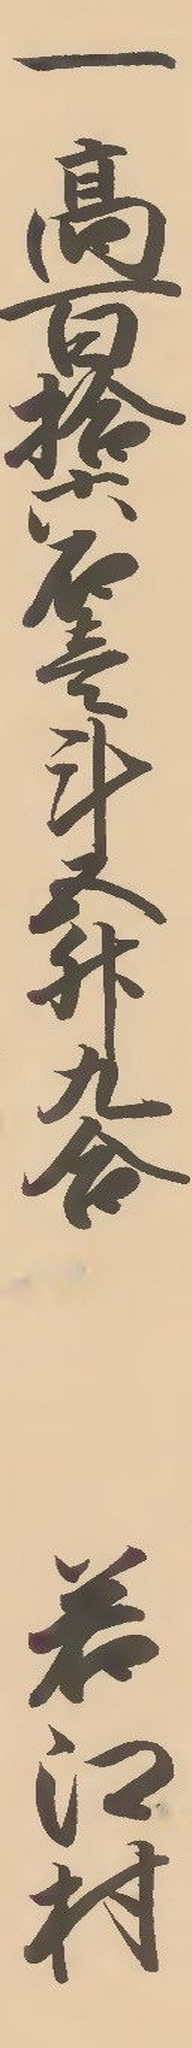一高百拾六石壱斗五升九合若江村
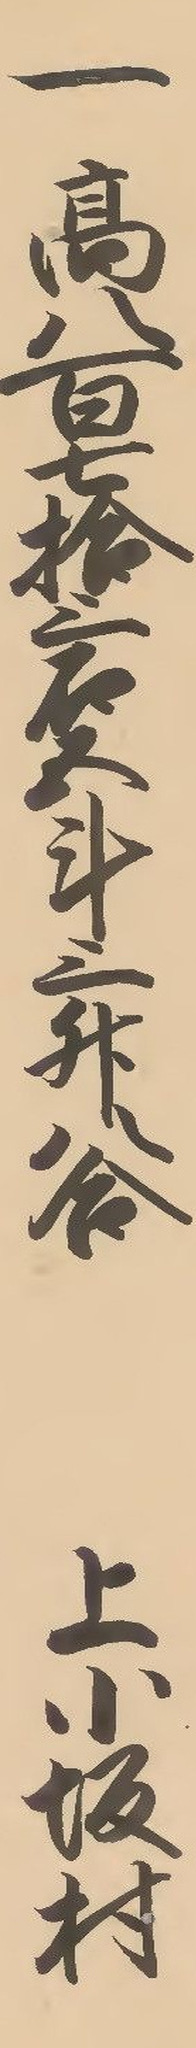一高八百七拾三石五斗三升八合上小坂村
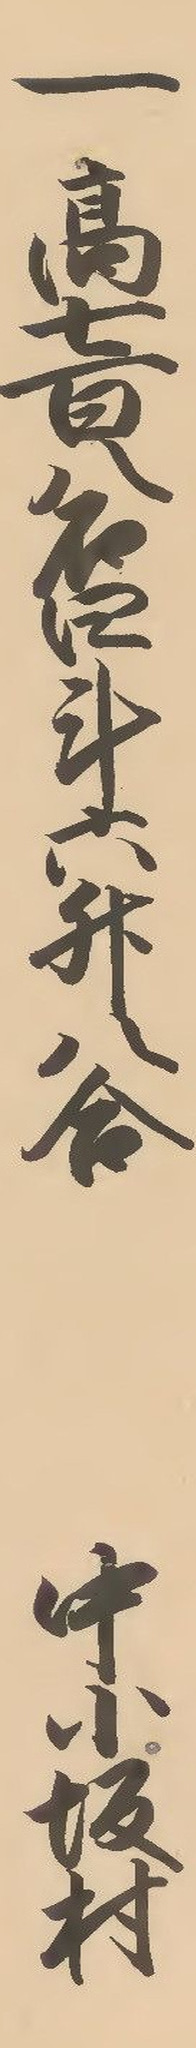一高七百八石四斗六升八合中小坂村
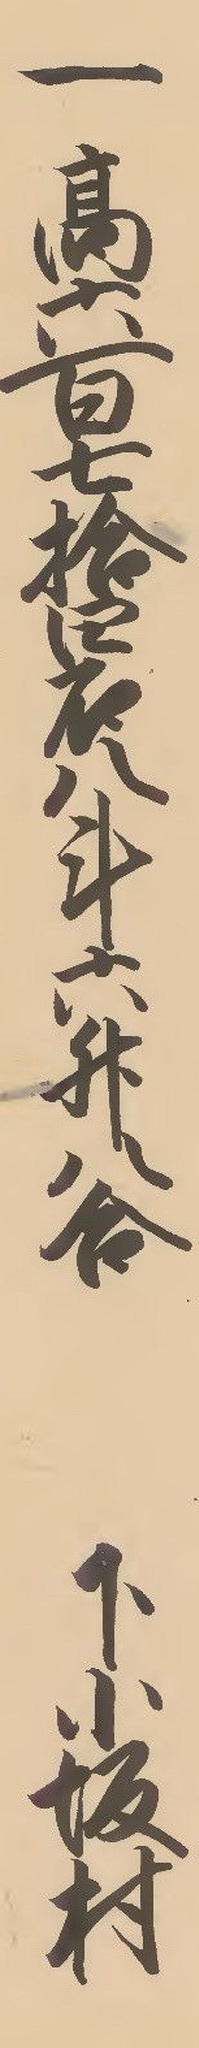一高六百七拾四石八斗六升八合下小坂村
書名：河内国郷帳
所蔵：国立公文書館 National Archives of Japan
